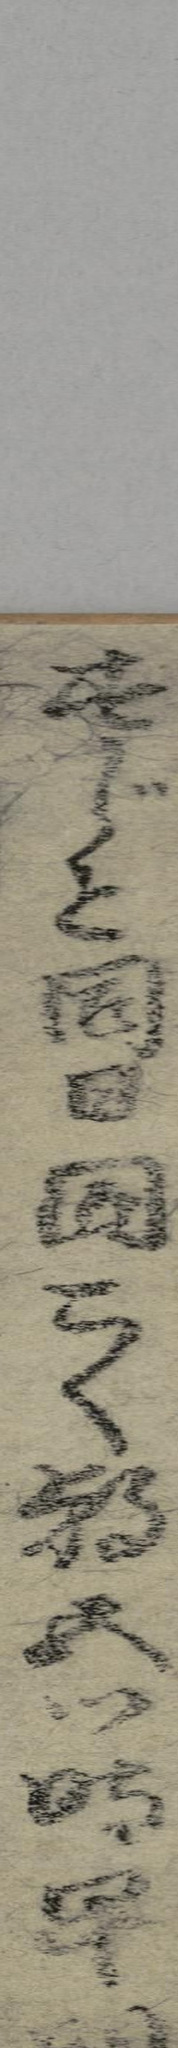すじと同日同こく朝五ッ時甲州
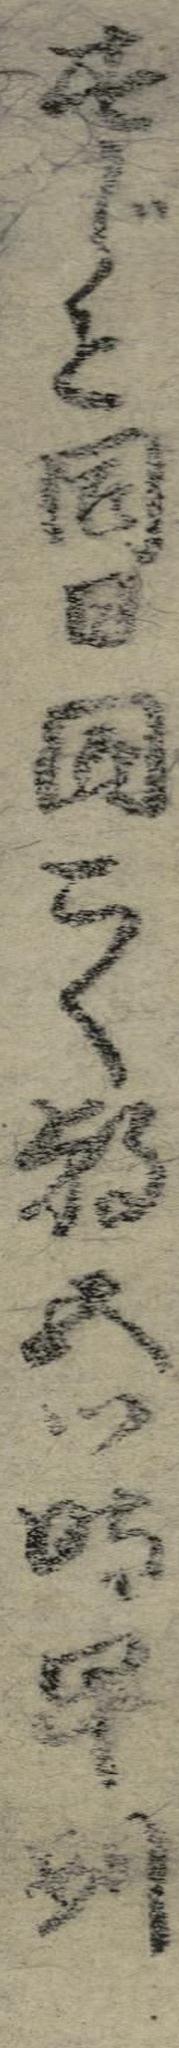すじと同日同こく朝五ッ時甲州
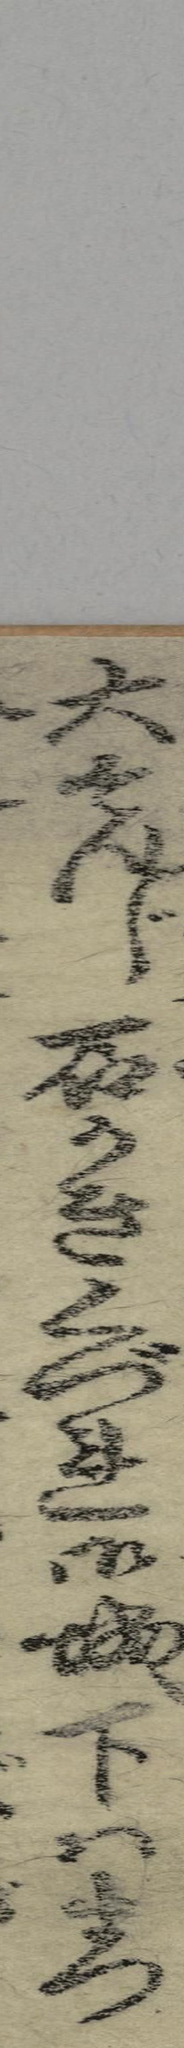大そんじ石がきくづれ御城下ハまつ
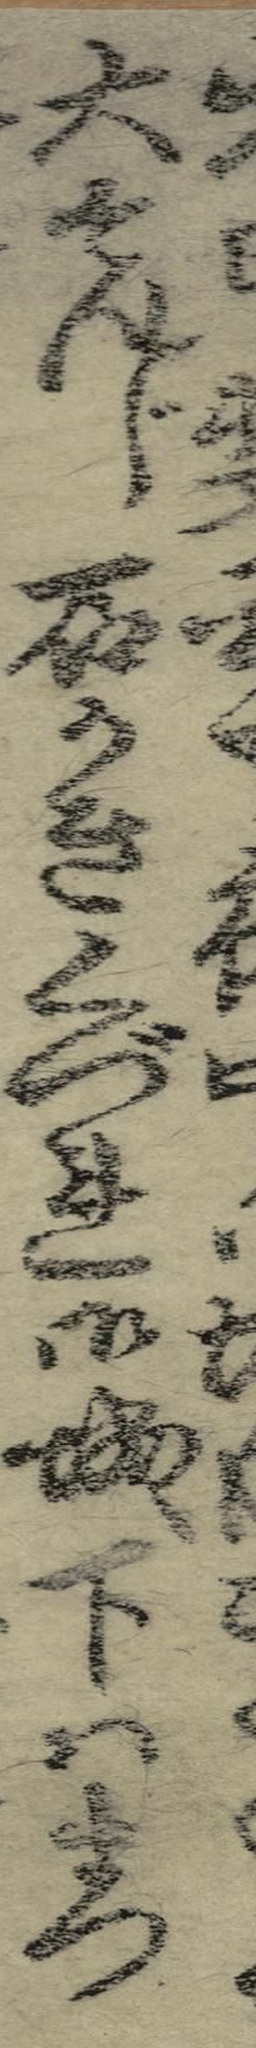大そんじ石がきくづれ御城下ハまつ
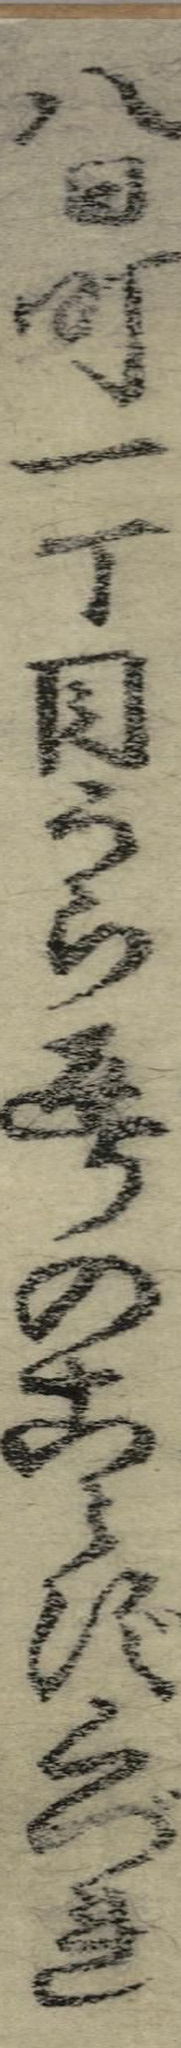八日町一丁目うら通りのこらずくづれ
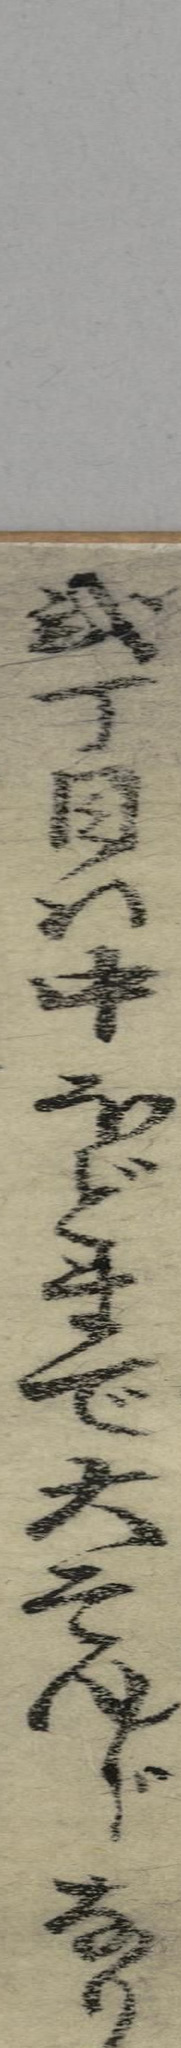弐丁目ハ中ほどまで大そんじなり
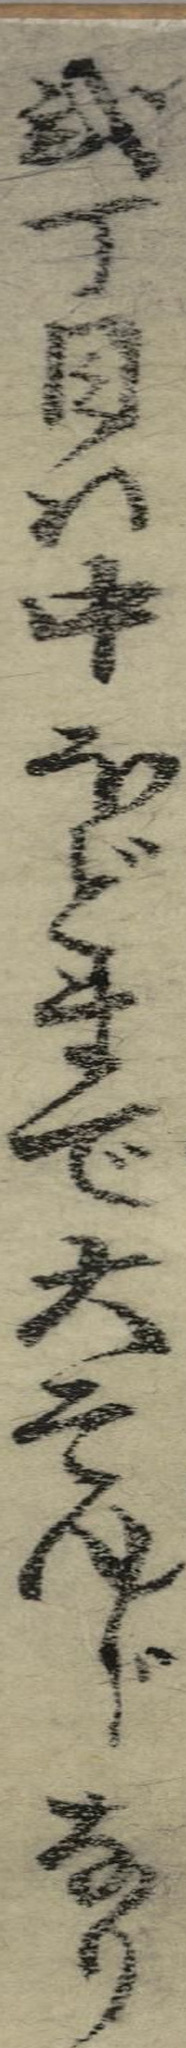弐丁目ハ中ほどまで大そんじなり
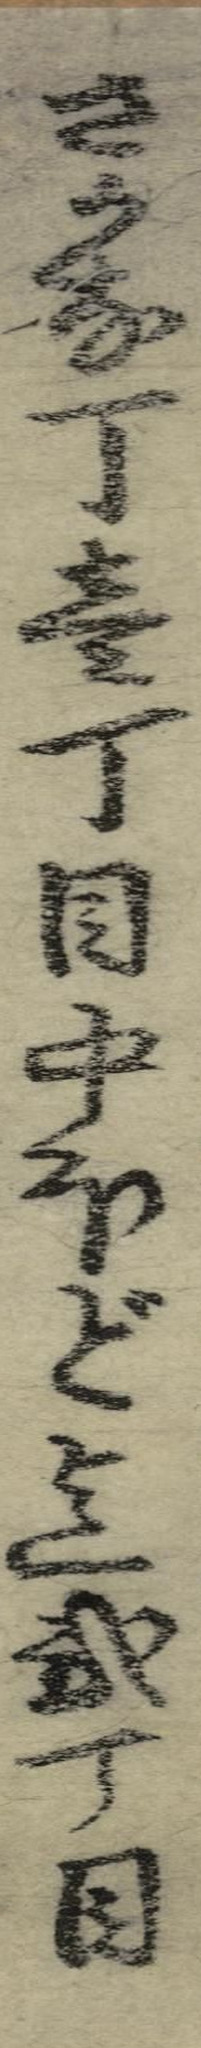さかな丁壱丁目中ほど迄弐丁目
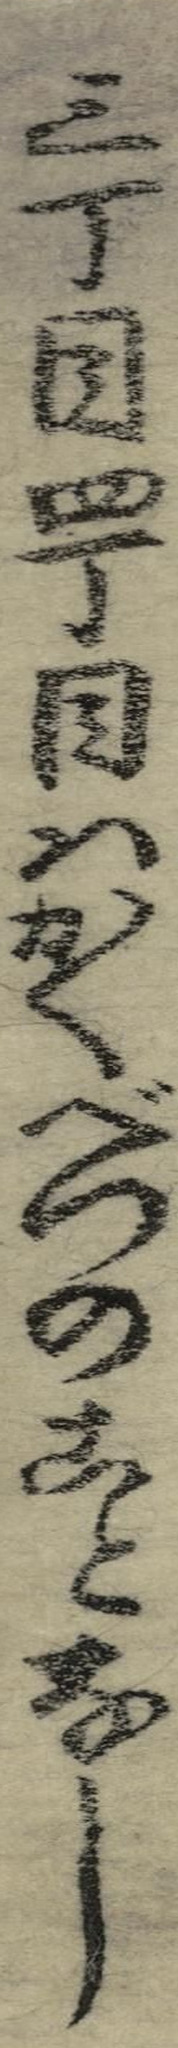三丁目四丁目ハかくべつのことなし
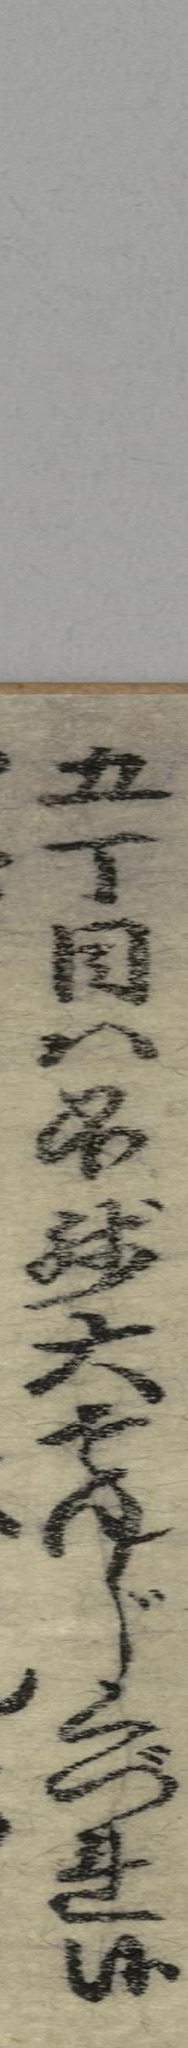五丁目ハ不残大そんじくづれ候
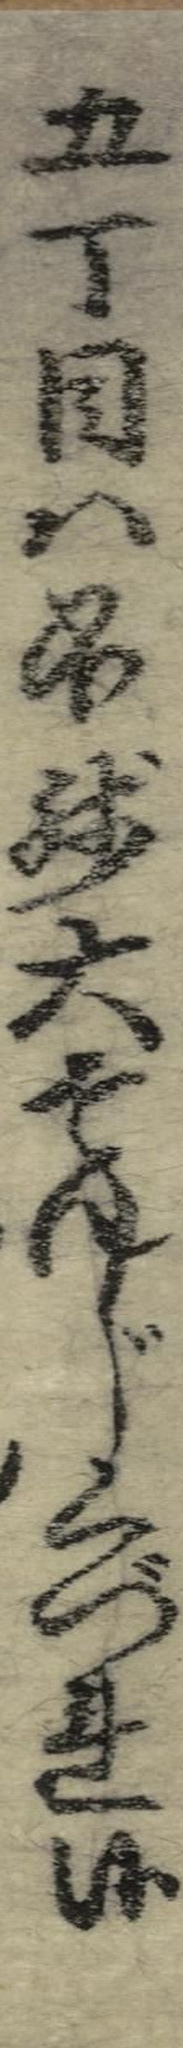五丁目ハ不残大そんじくづれ候
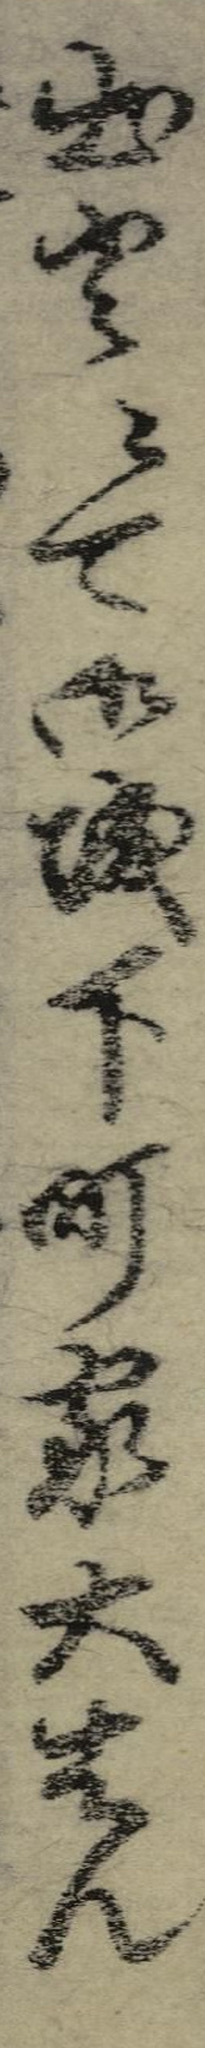出火二て御城下町家大はん
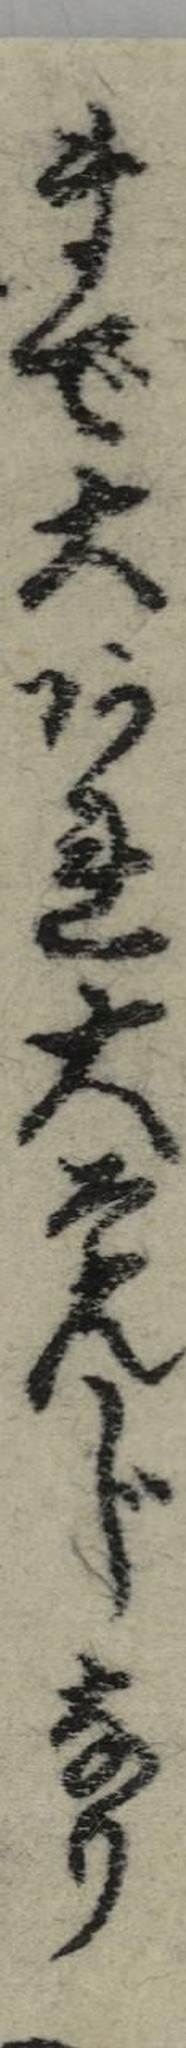まで大あれ大そんじなり
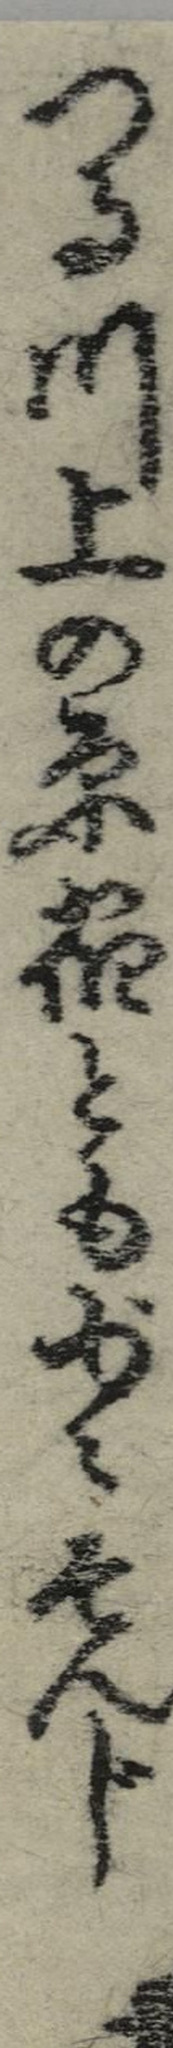つる川上の原宿とも少々そんじ
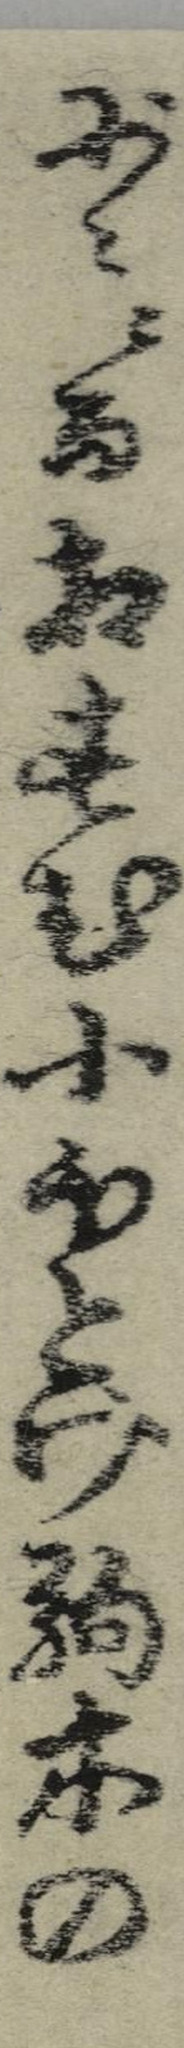少々二て相すむ小ほとけ駒木の
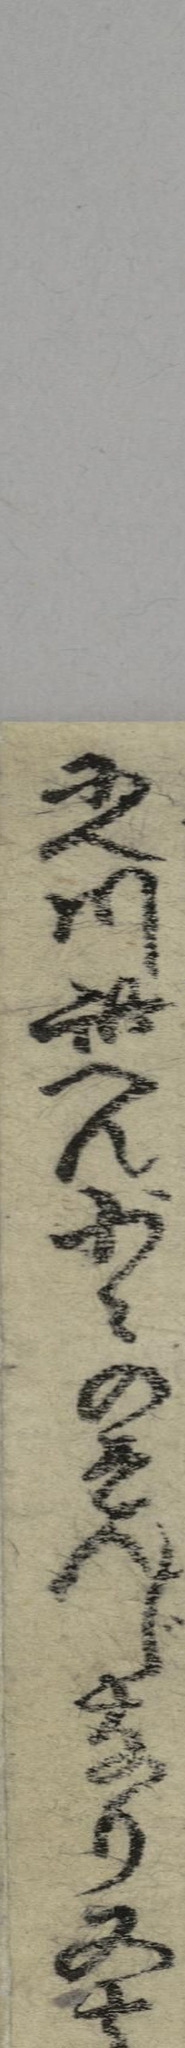にへ川此へん少々のそんじはかり又は
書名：諸國大地震并大津浪
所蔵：東京大学地震研究所図書室 Earthquake Research Institute Library, The University of Tokyo, JAPAN
